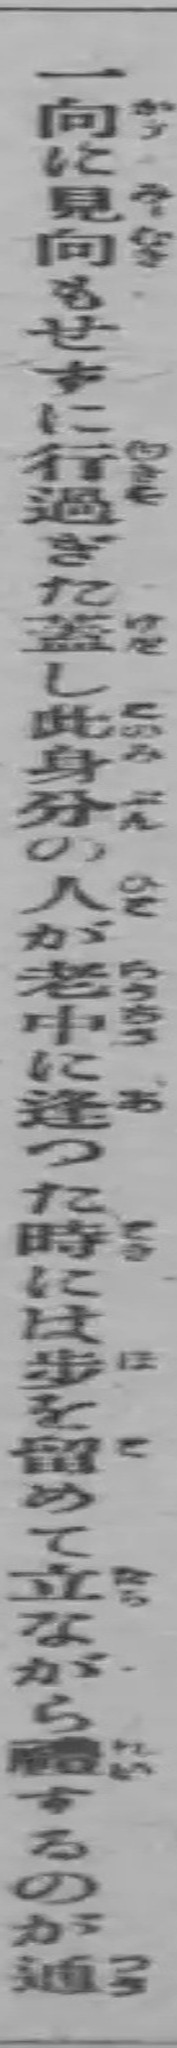一向に見向もせずに行過ぎた蓋し此身分の人が老中に逢つた時には歩を留めて立ながら礼するのが通
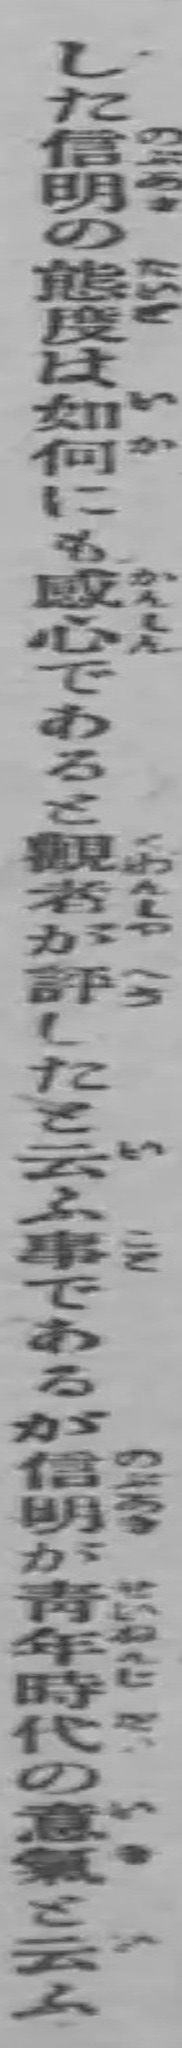した信明の態度は如何にも感心であると観者が評したと云ふ事であるが信明が青年時代の意気と云ふ
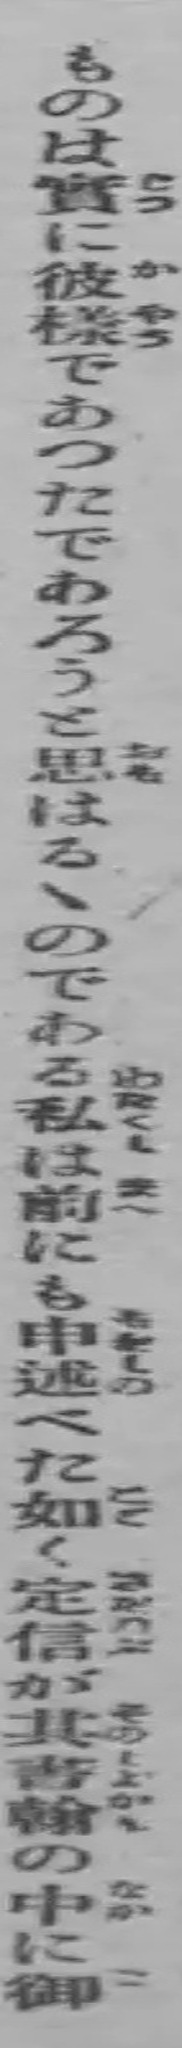ものは実に彼様であつたであろうと思はるゝのである私は前にも申述べた如く定信が其書翰の中に御
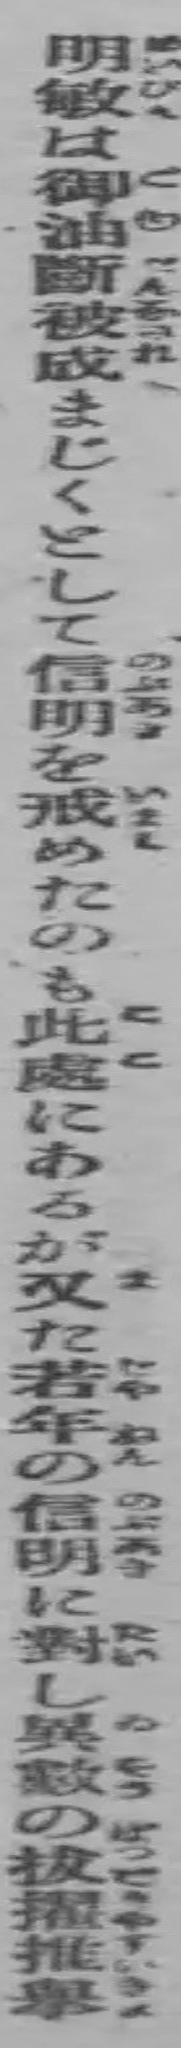明敏は御油断被成まじくとして信明を戒めたのも此処にあるが又た若年の信明に対し異数の抜擢推挙
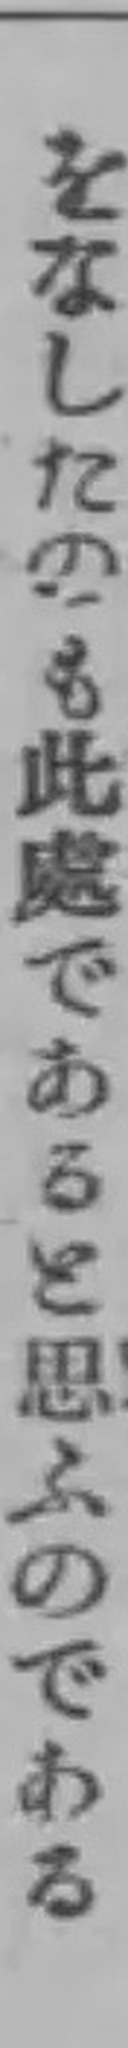をなしたのも此処であると思ふのである
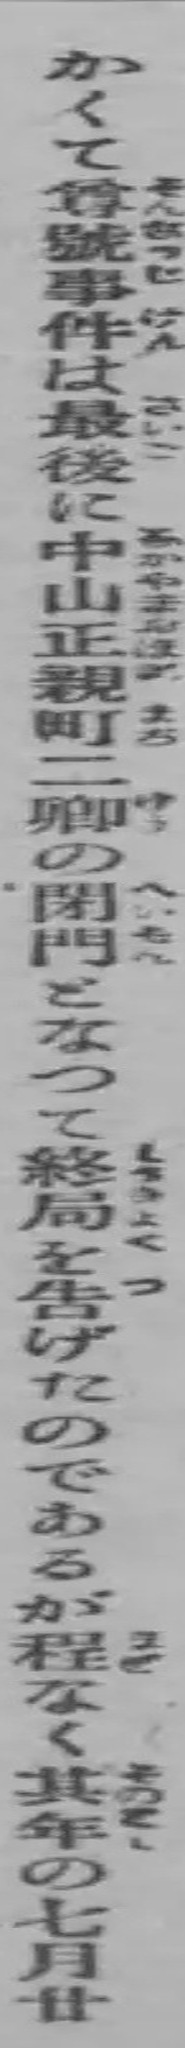かくて尊号事件は最後に中山正親町二卿の閉門となつて終局を告げたのであるが程なく其年の七月廿
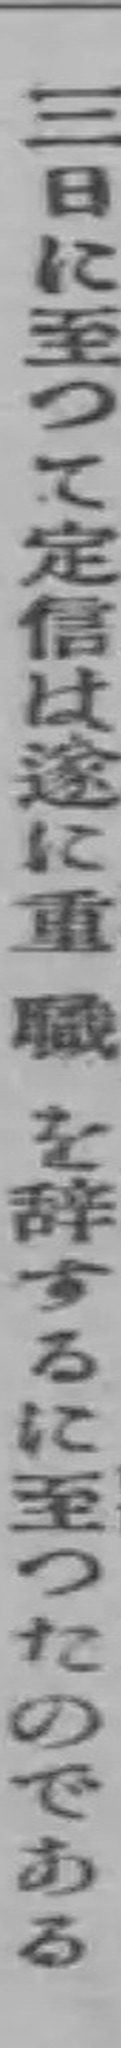三日に至つて定信は遂に重職を辞するに至つたのである
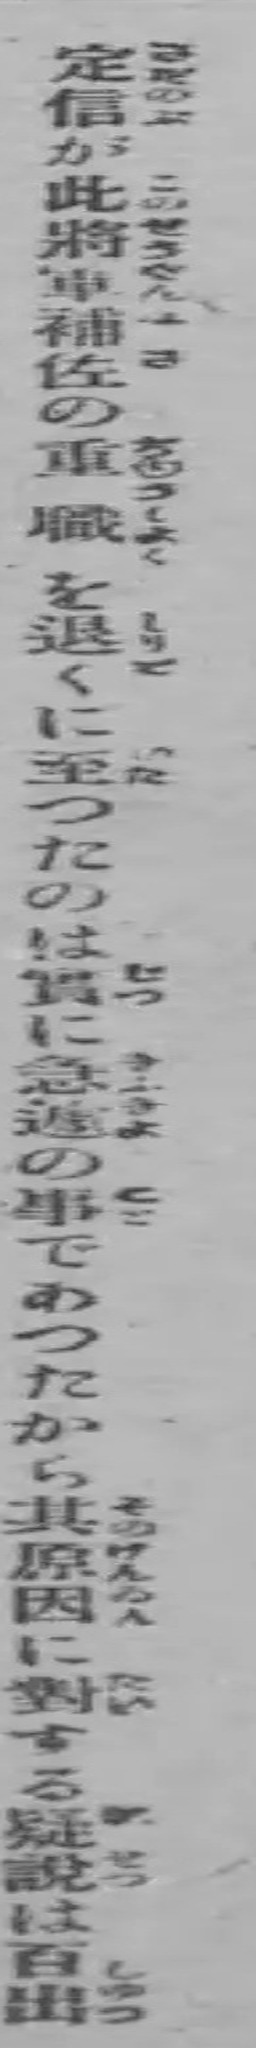定信の退職定信が此将軍補佐の重職を退くに至つたのは実に急遽の事であつたから其原因に対する疑説は百出
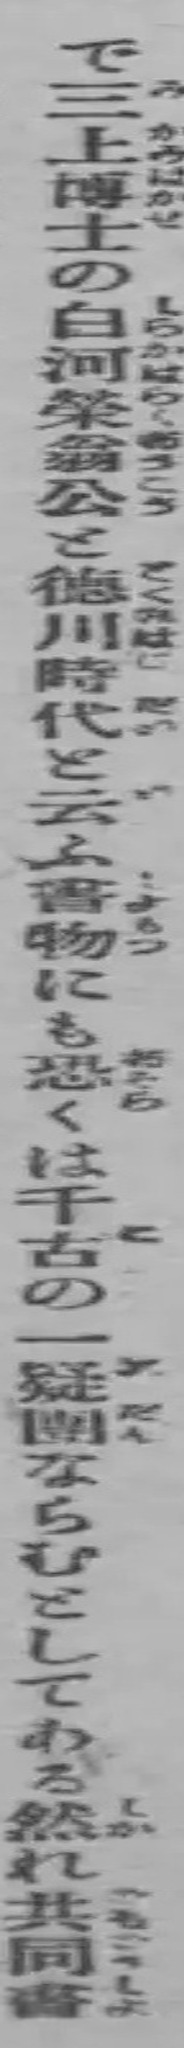で三上博士の白河楽翁公と徳川時代と云ふ書物にも恐くは千古の一疑団ならむとしてある然れ共同書
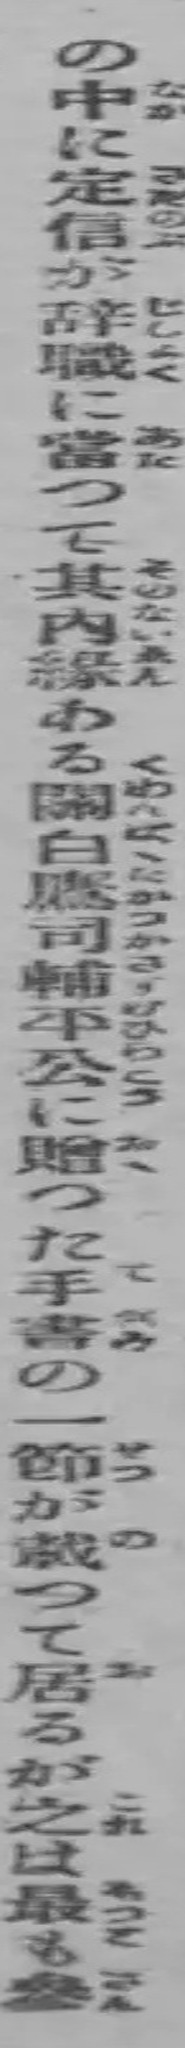の中に定信が辞職に当つて其内縁ある関白鷹司輔平公に贈つた手書の一節が載つて居るが之は最も参
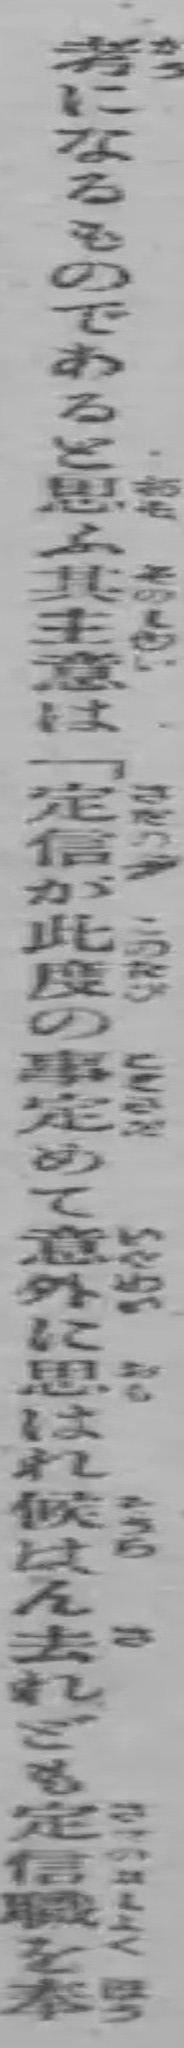考になるものであると思ふ其主意は「定信が此度の事定めて意外に思はれ候はん去れども定信職を奉
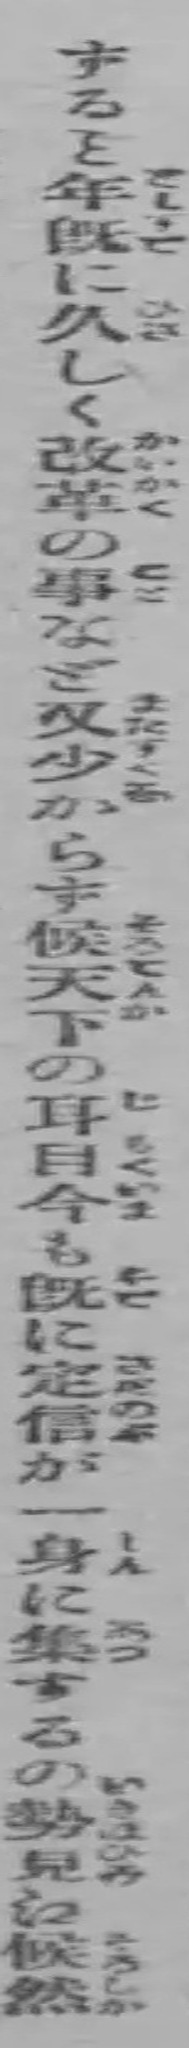ずること年既に久しく改革の事など又少からず候天下の耳目今も既に定信が一身に集するの勢見え候然
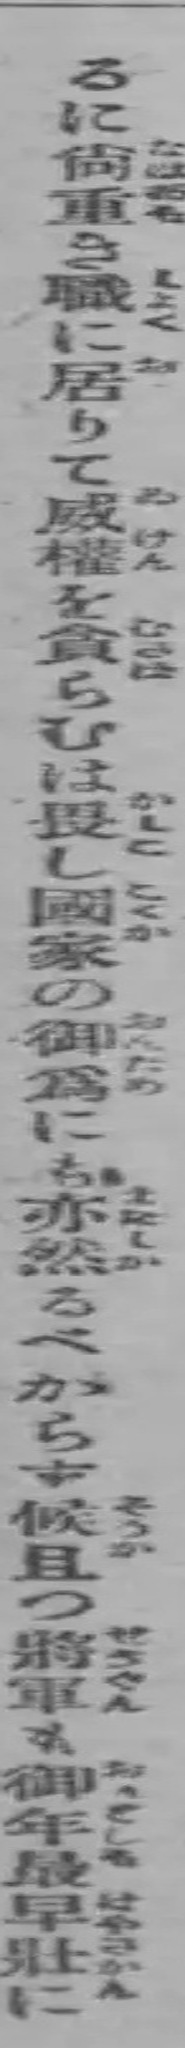るに尚重き職に居りて威権を貪らむは畏し国家の御為にも亦然るべからず候且つ将軍も御年最早壮に

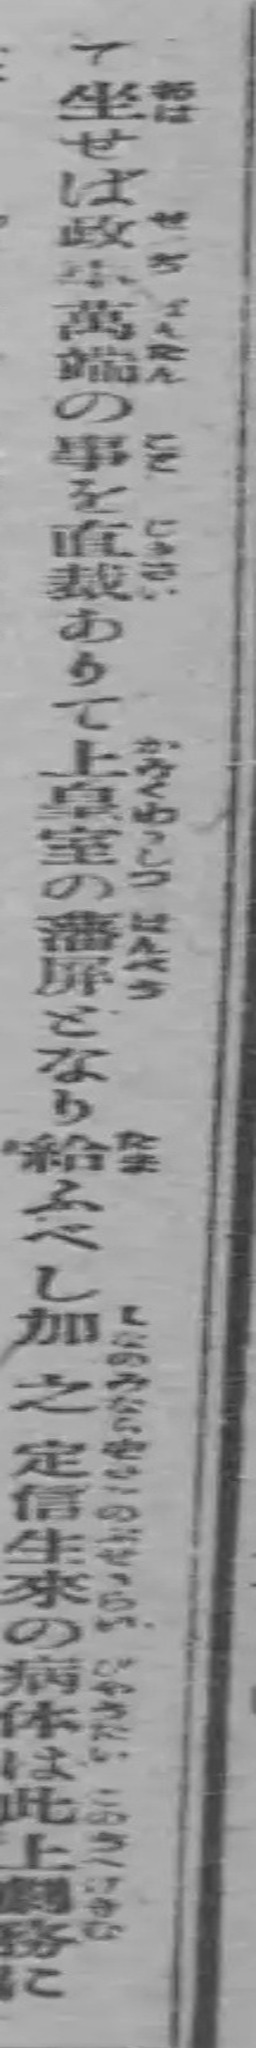て坐せば政事万端の事を直裁ありて上皇室の藩屏となり給ふべし加之定信生来の病体は此上劇務に
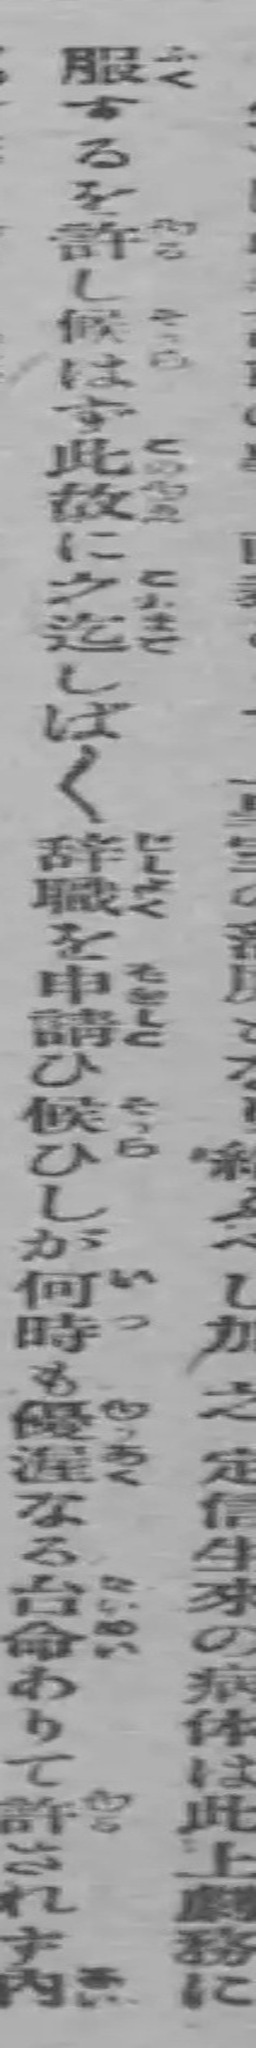服するを許し候はず此故に之迄しば〳〵辞職を申請ひ候ひしが何時も優渥なる台命ありて許されず内
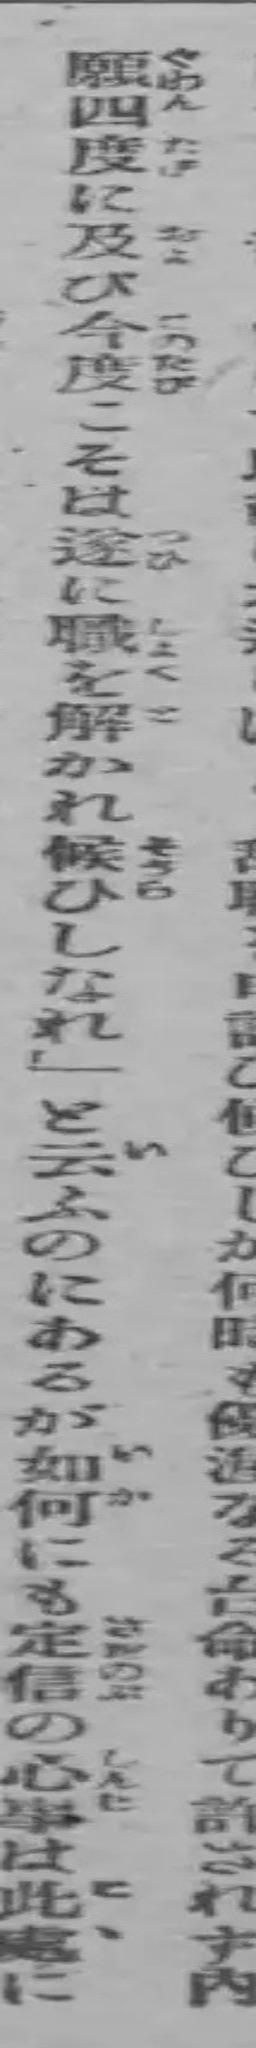願四度に及び今度こそは遂に職を解かれ候ひしなれ」と云ふのにあるが如何にも定信の心事は此処に
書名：豊橋市史談
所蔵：国立国会図書館 National Diet Library, JAPAN
